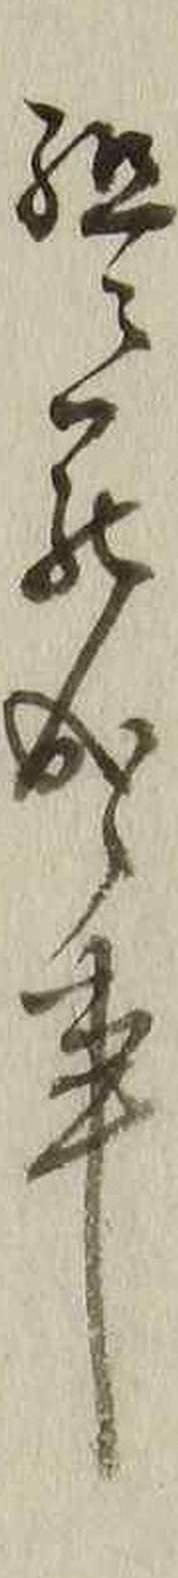組ニ罷成候事
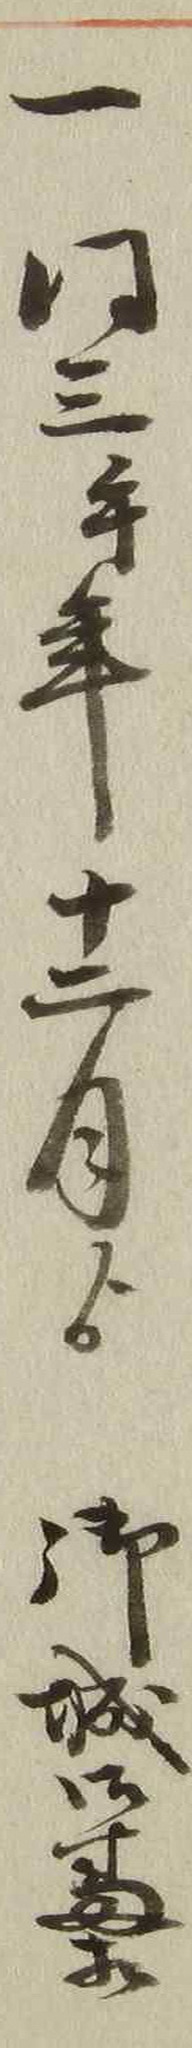一同三午年十二月ゟ御城御番相
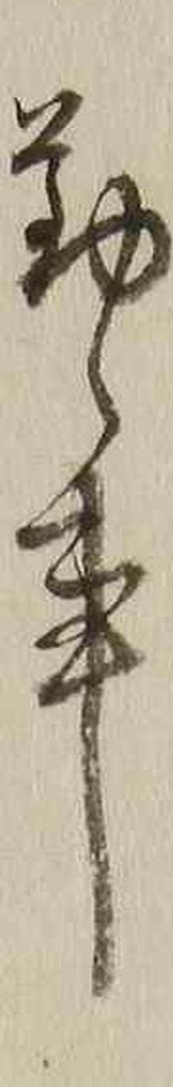勤候事
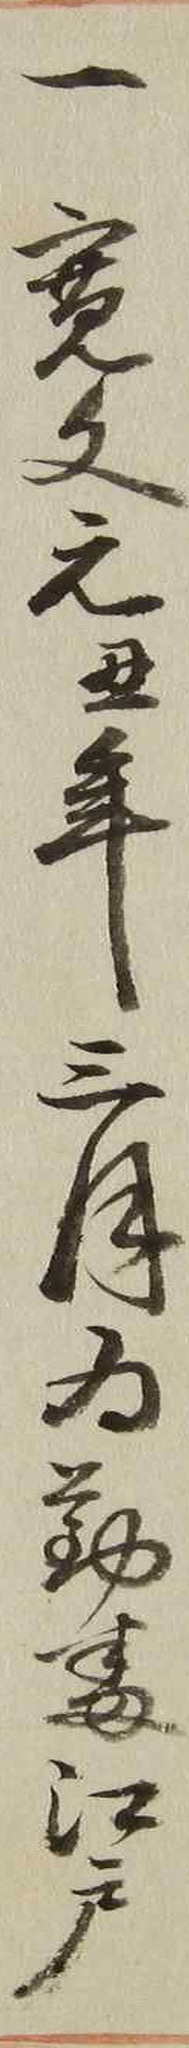一寛文元丑年三月為勤番江戸
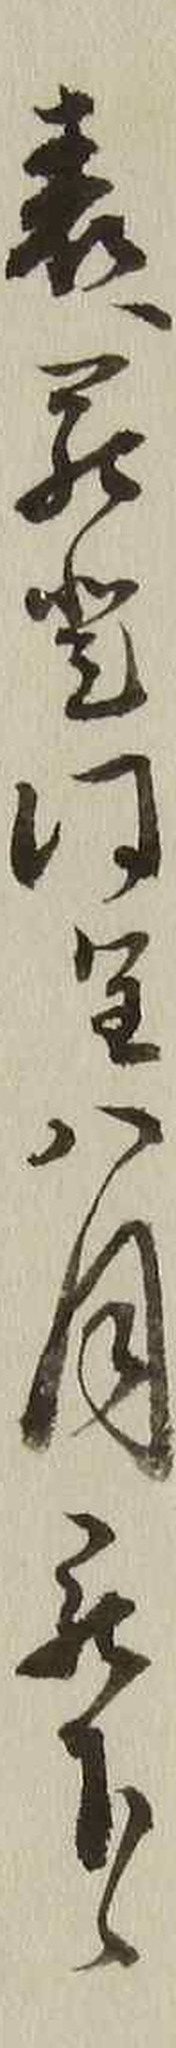表へ罷登同閏八月罷下候
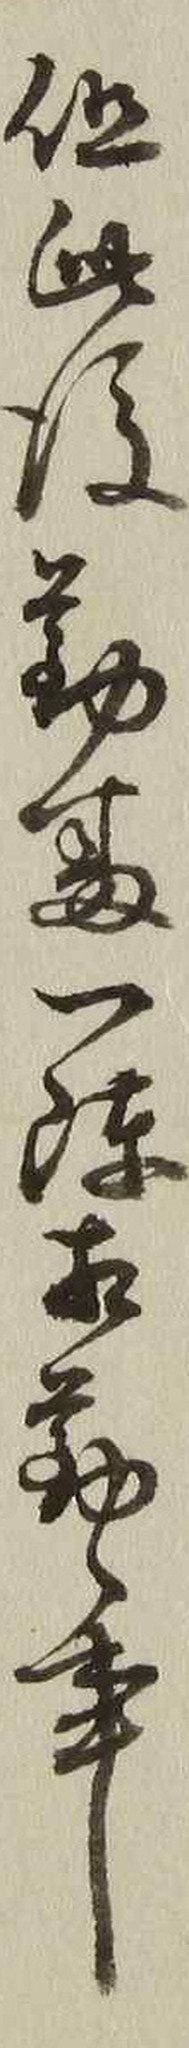但此後勤番一陣相勤候事
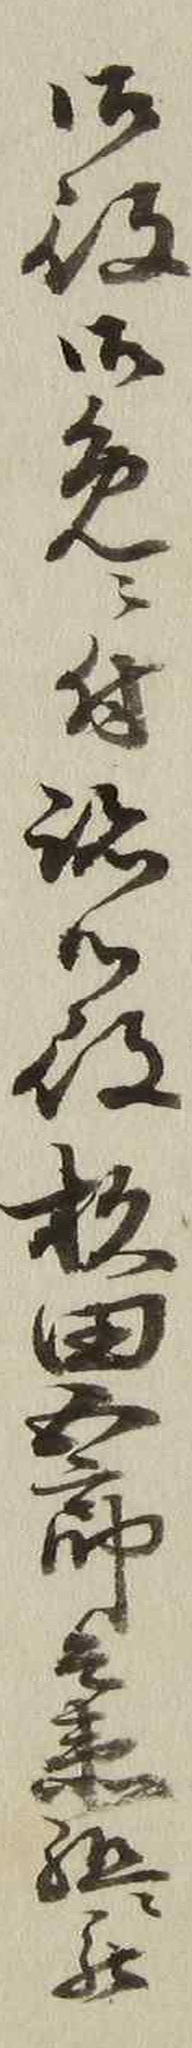御役御免ニ付跡御役杉田五郎兵衛組ニ罷
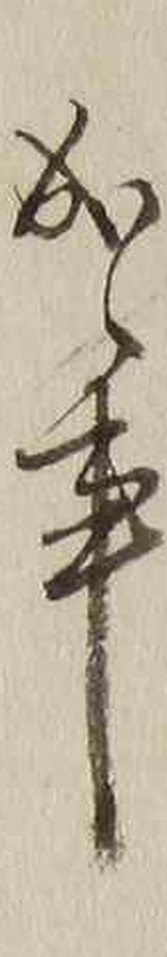成候事
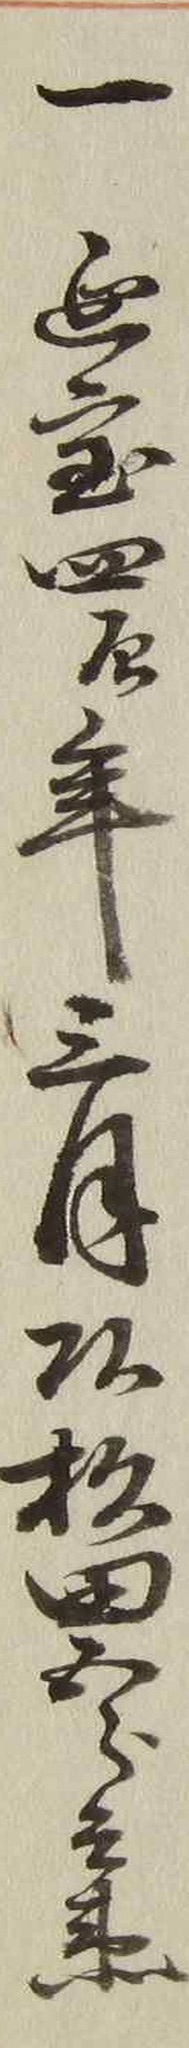一延宝四辰年三月頭杉田五郎兵衛
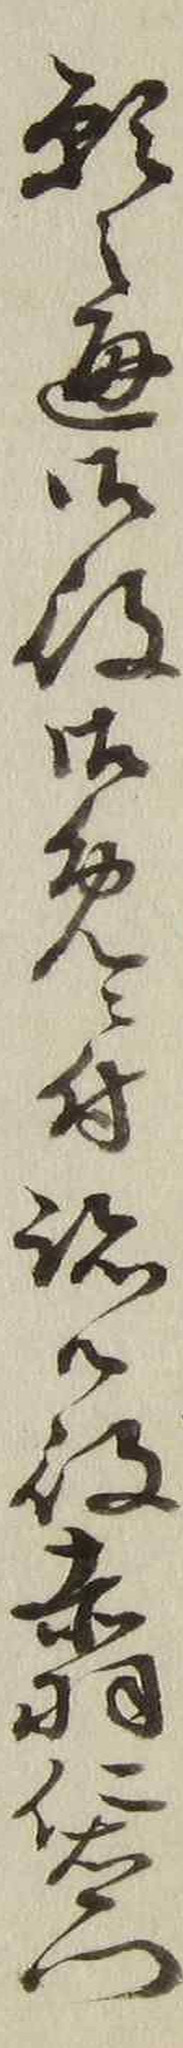願之通御役御免ニ付跡御役赤羽仁右衛門
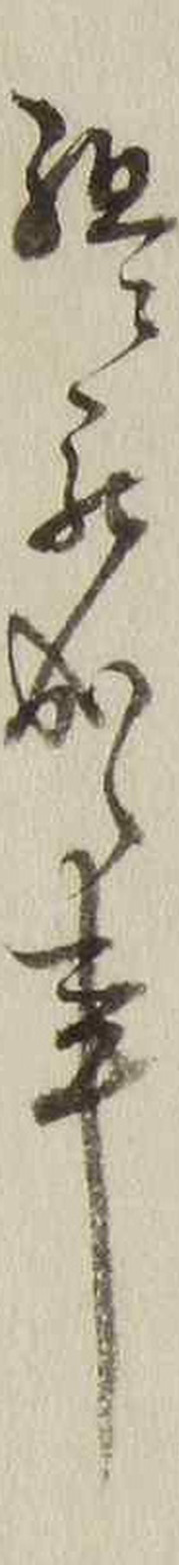組ニ罷成候事
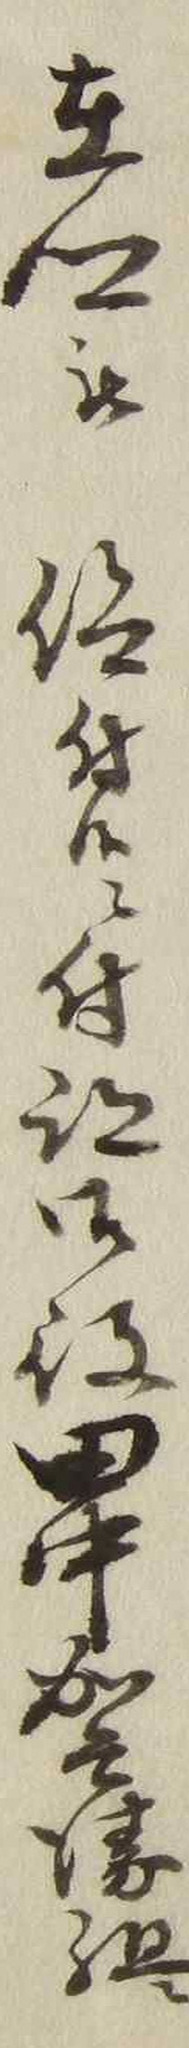在郷被仰付候ニ付跡御役田中加兵衛組ニ

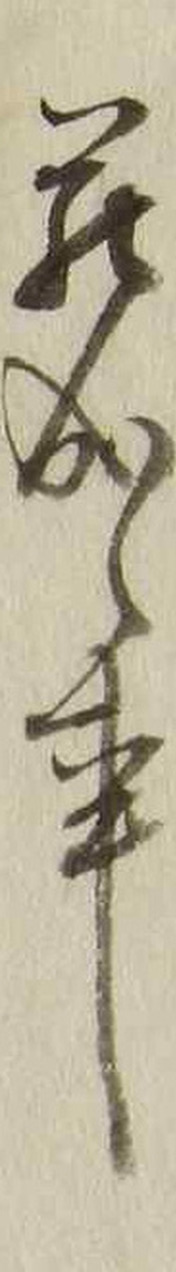罷成候事
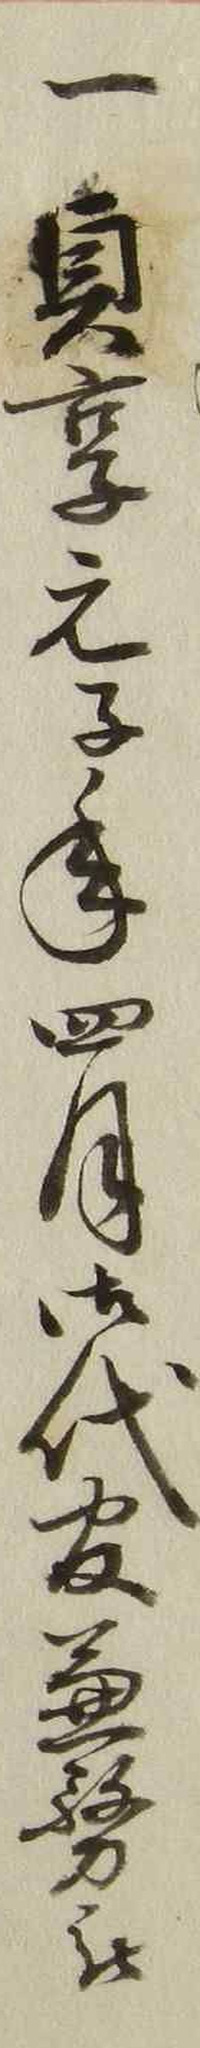一貞享元子年四月御代官兼務被
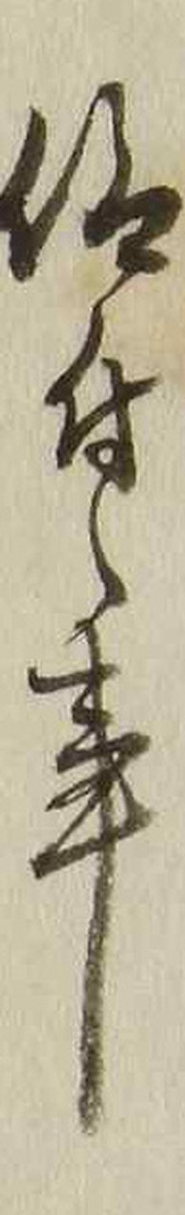仰付候事
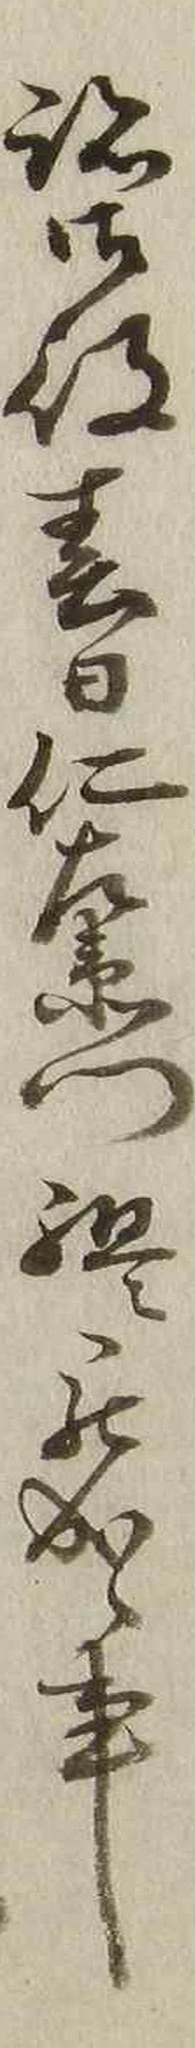跡御役春日仁左衛門組ニ罷成候事
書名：諸士系譜　巻之27　い之部27
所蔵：会津若松市立会津図書館
